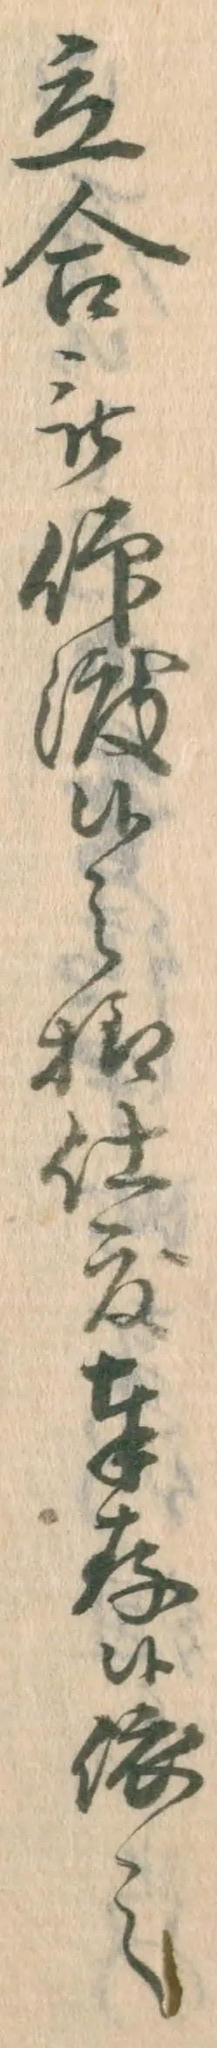立合被仰渡候之様仕度奉存候依之
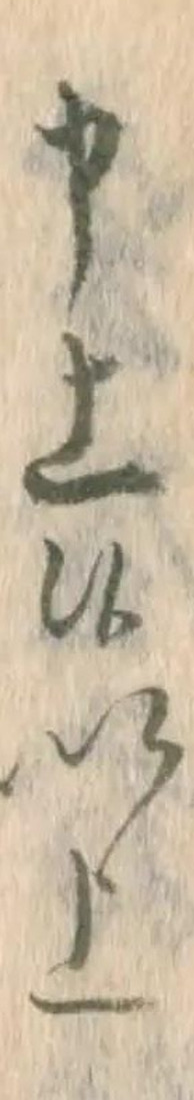申上候以上
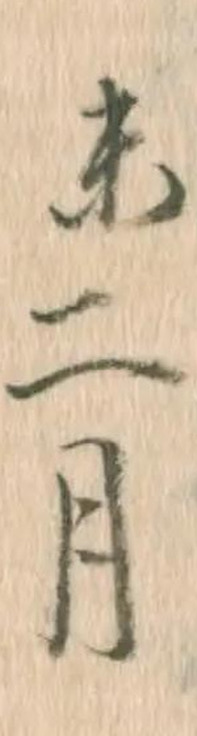未二月
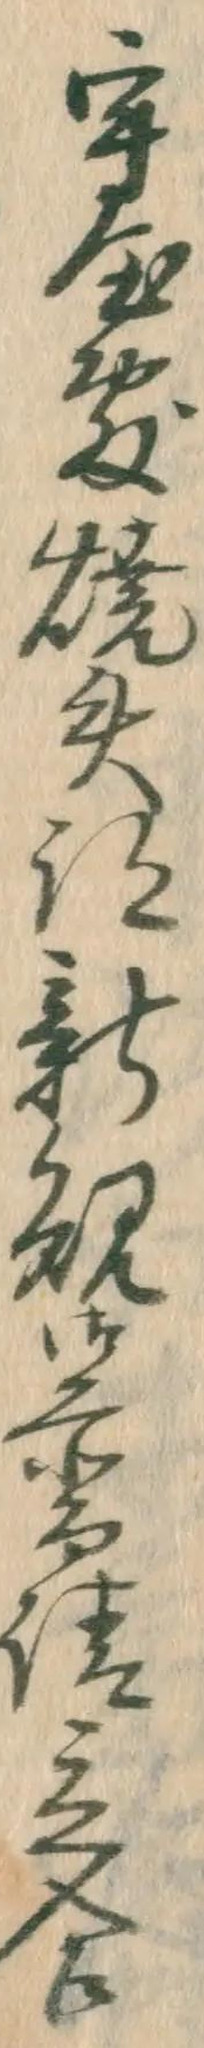│牢屋敷焼失跡新規御普請立合
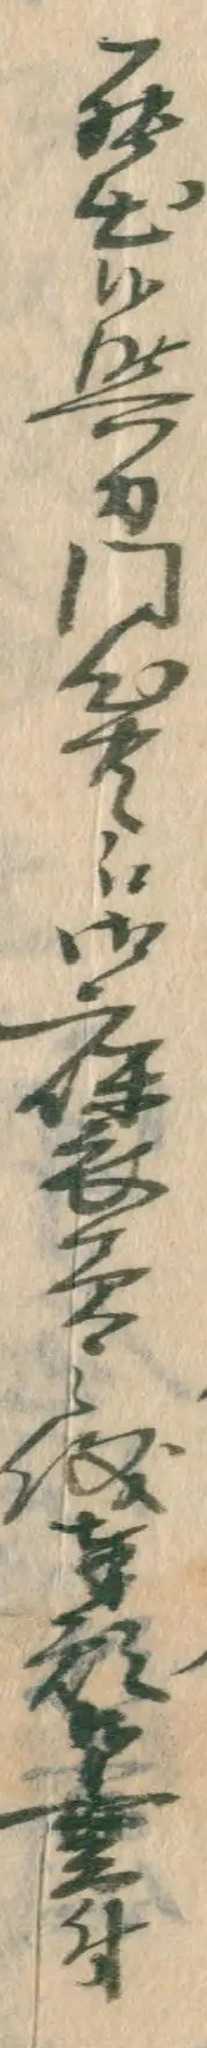│罷出候与力同心共え御褒美之儀奉願候書付
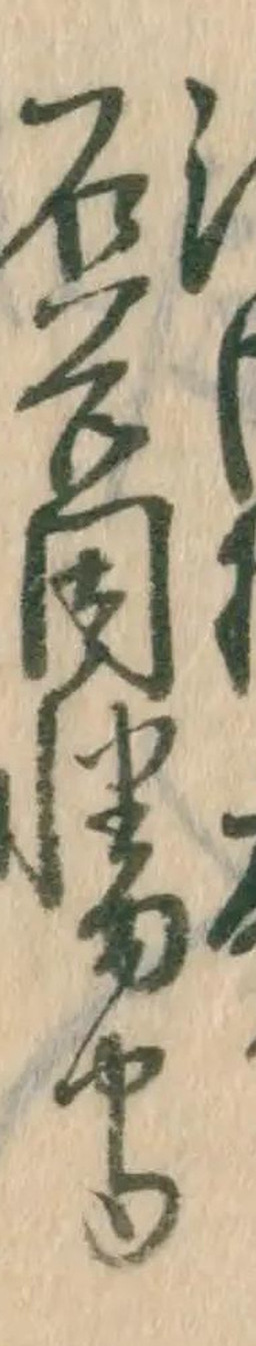│石谷因幡守
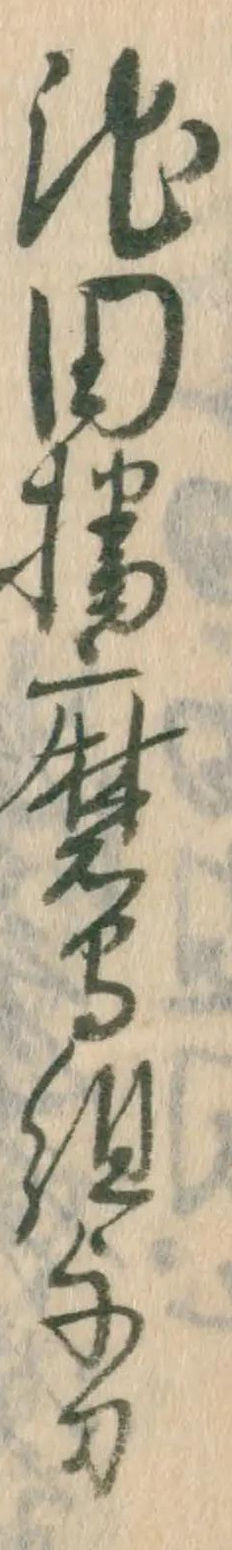池田播磨守組与力
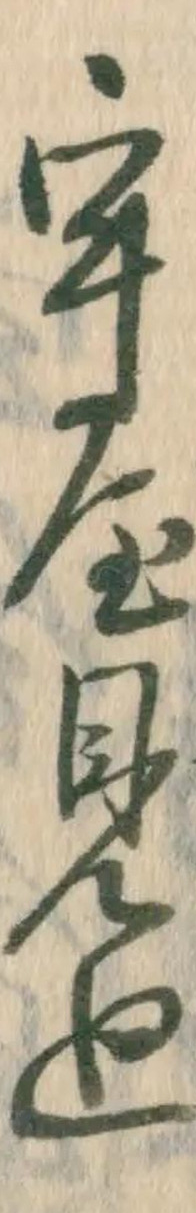牢屋見廻
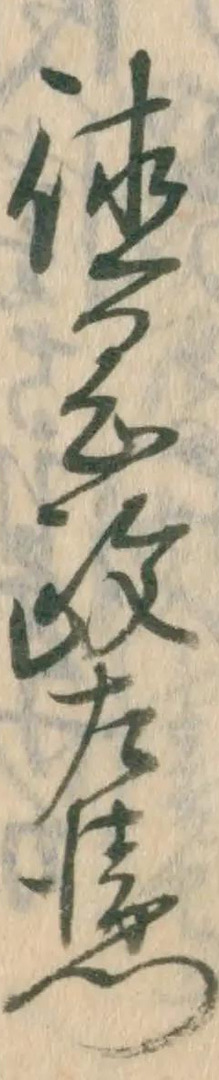徳岡政左衛門

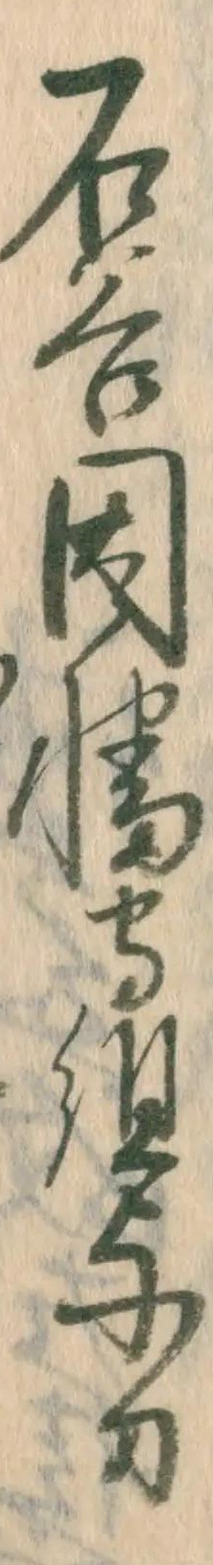石谷因幡守組与力
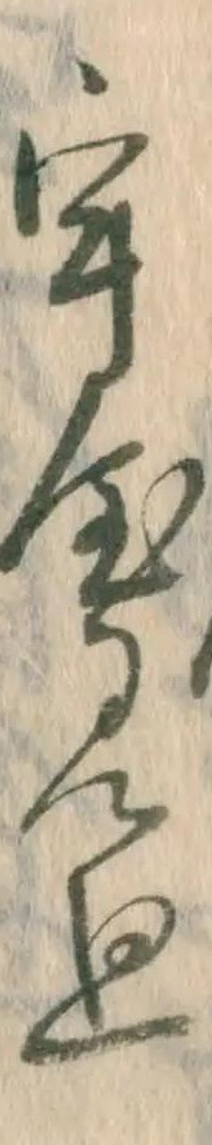牢屋見廻
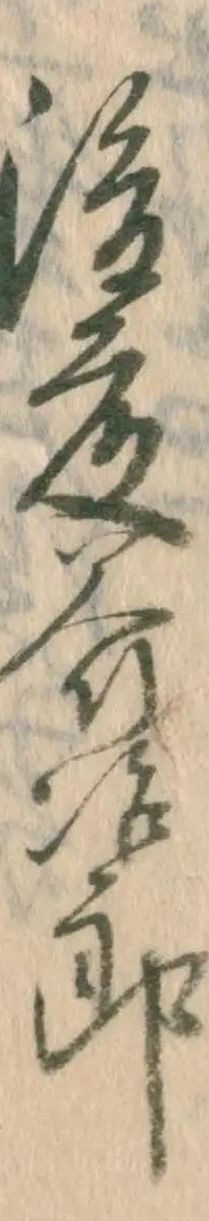後藤斧治郎
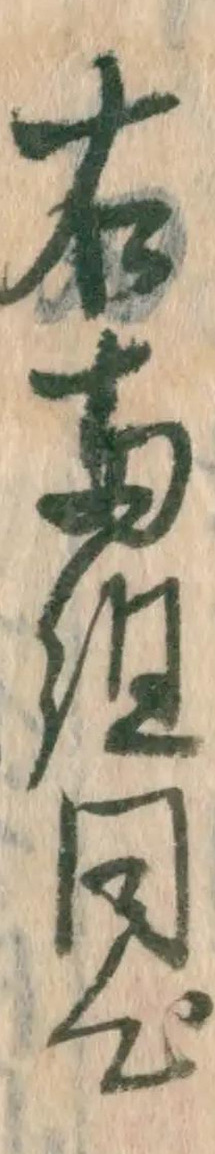右両組同心
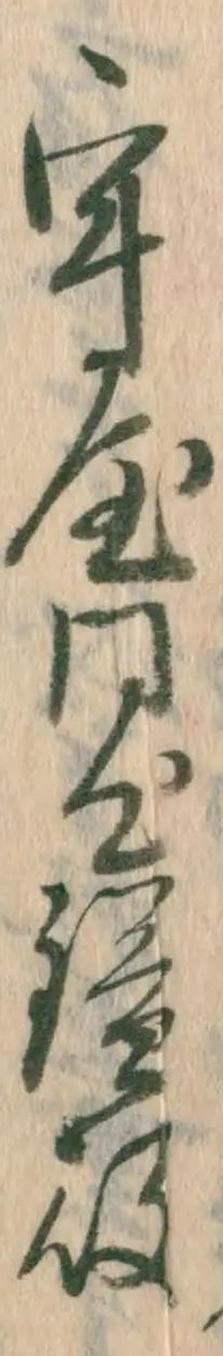牢屋同心鎰役
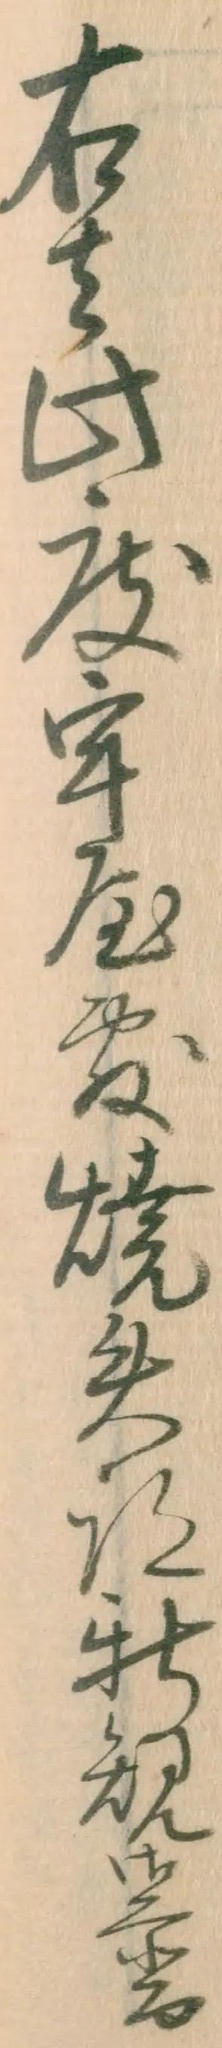右は此度牢屋敷焼失跡新規御普
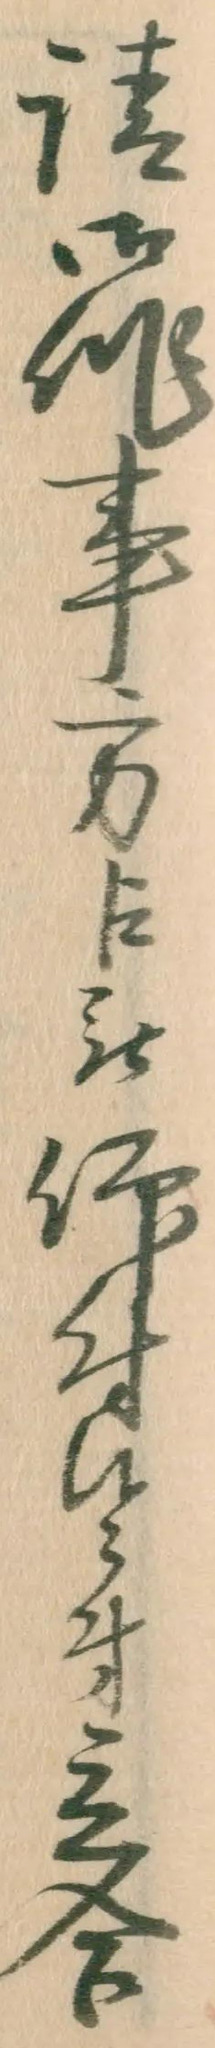請御作事方え被仰付候ニ付立合
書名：七十冊物類集 71巻. [44] 四十三 牢屋敷御普請御修覆地震ニ付骨折候牢屋掛御褒美之部
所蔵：国立国会図書館 National Diet Library, JAPAN
